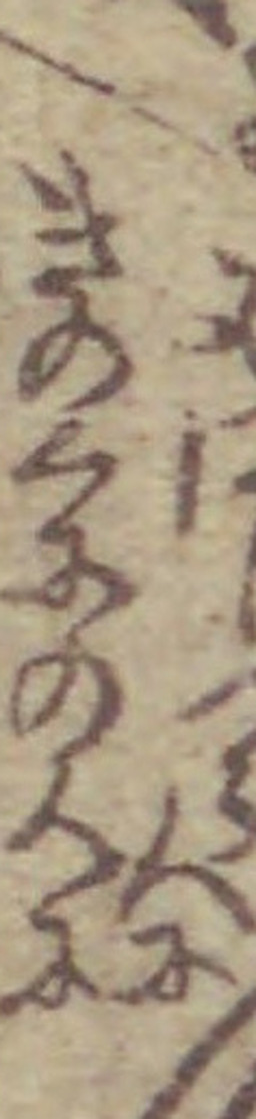きのくにの人に
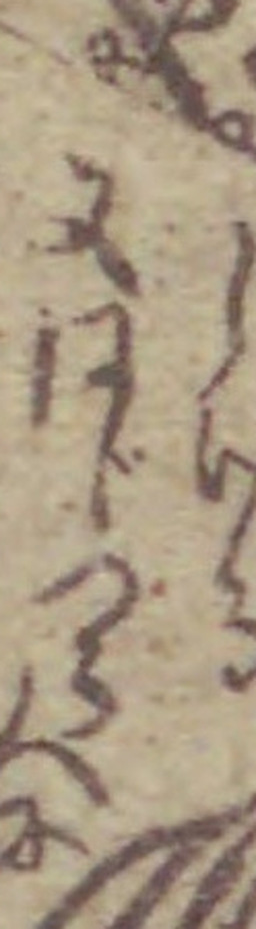又同じつう人に
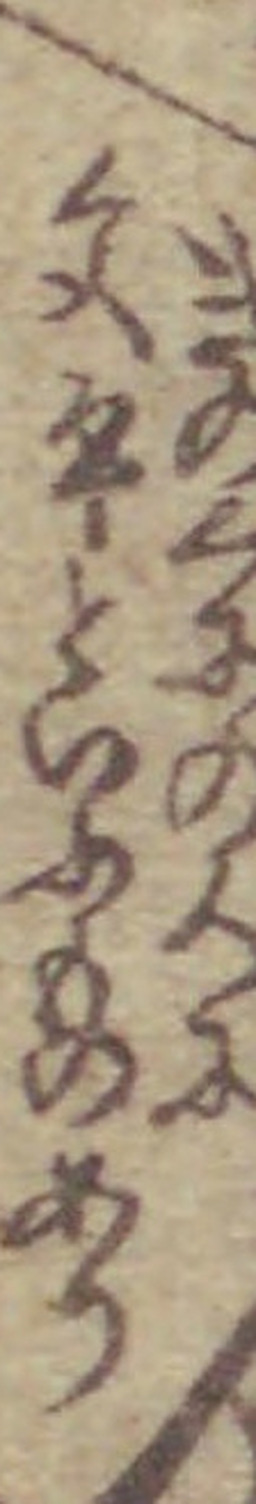文平といふものあり
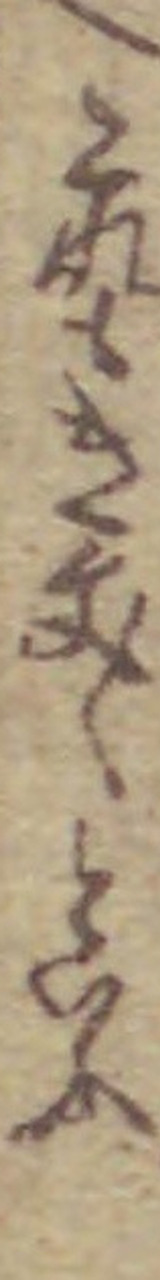これもき文〳〵といふ

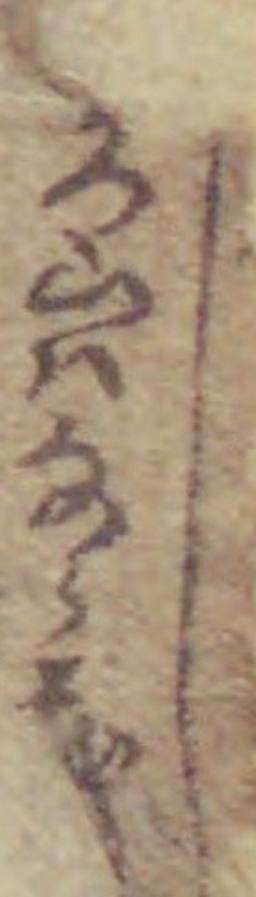かつ山はなら茂
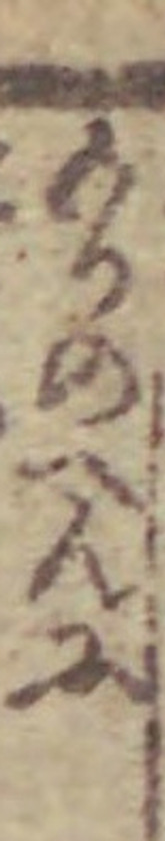もりのへんに
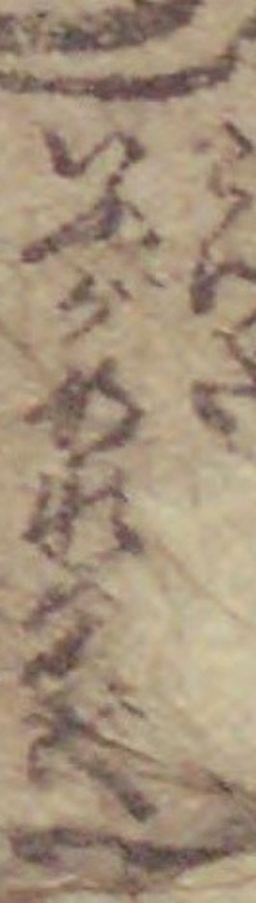いふがあれ
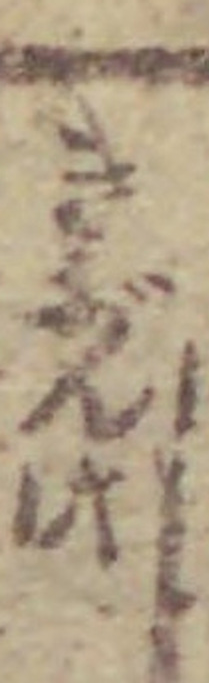きぶん此
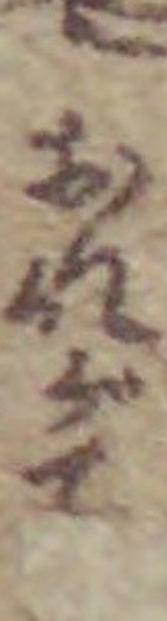おれがも
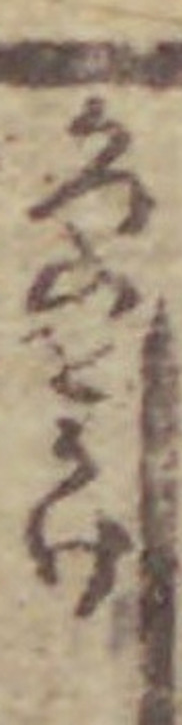かつ山をうけ
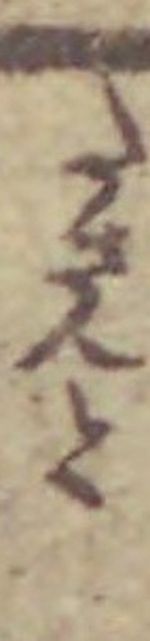たさんと
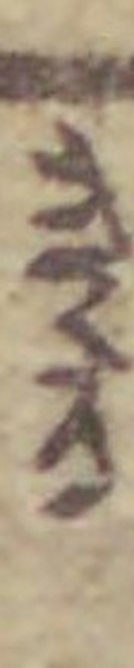きたる
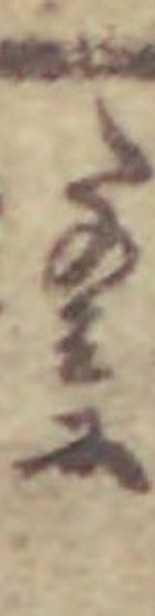たのみに
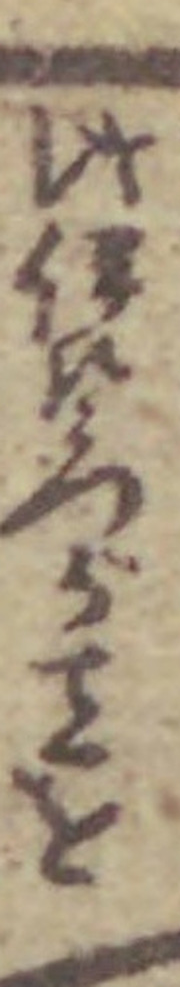この伊左衛門がことを
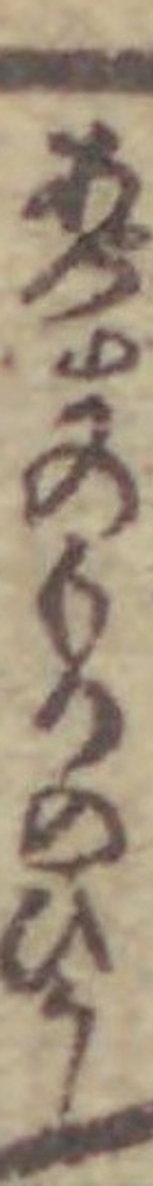あづまのもりのひかし
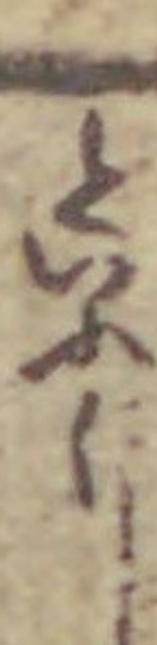といふく
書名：大通其面影 2巻
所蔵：国立国会図書館 National Diet Library, JAPAN
